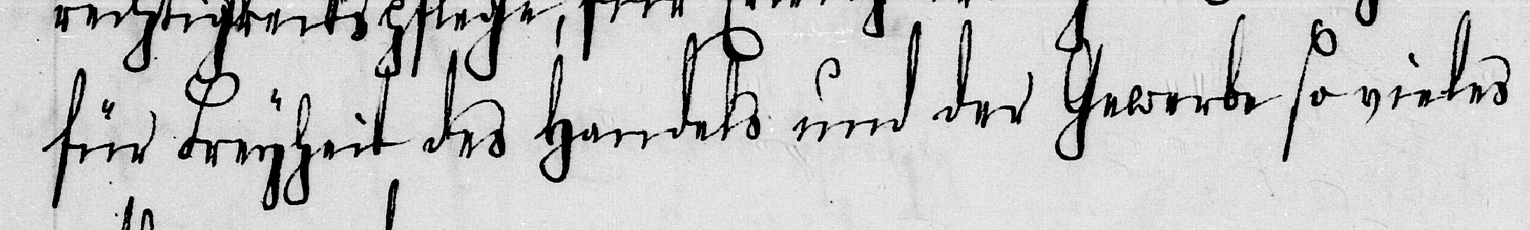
für Freyheit des Handels und der Gewerbe so vieles
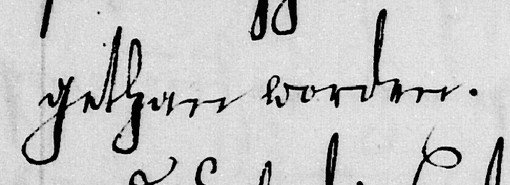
gethan worden.
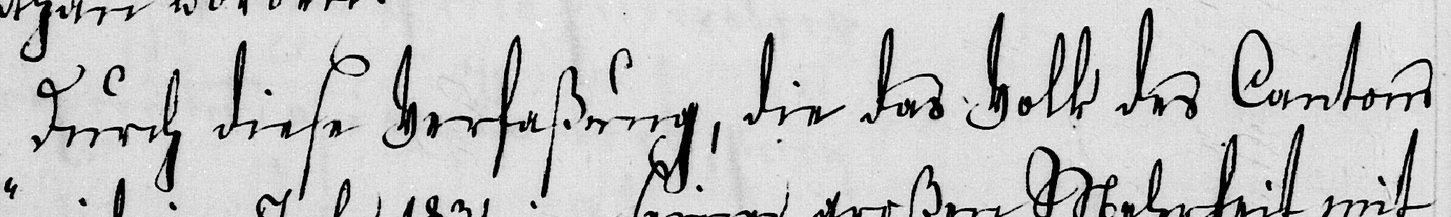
Durch diese Verfaßung, die das Volk des Cantons
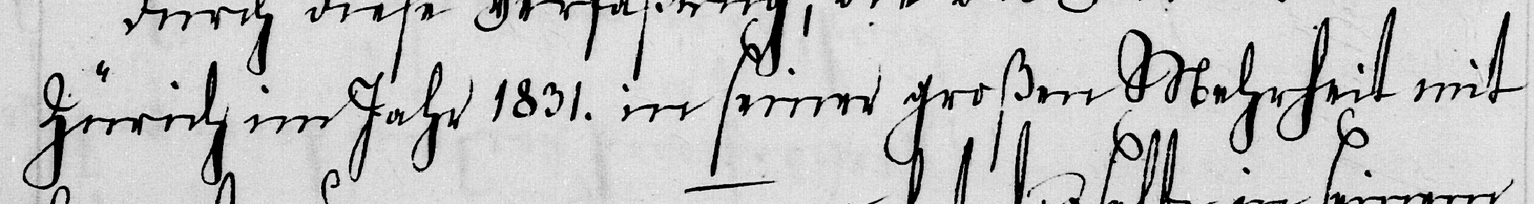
Zürich im Jahr 1831. in seiner großen Mehrheit mit
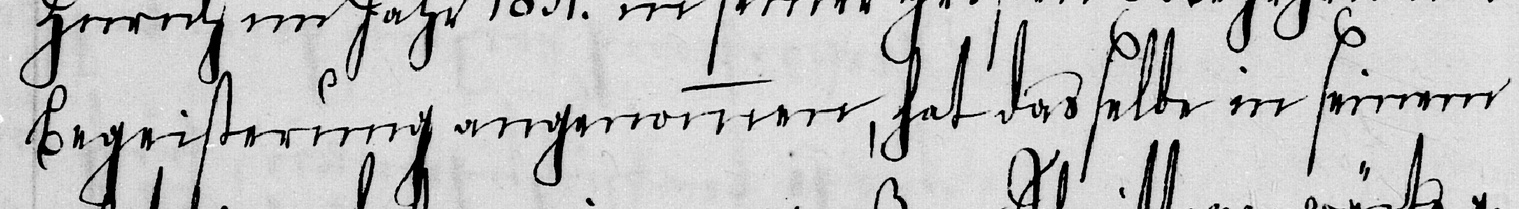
Begeisterung angenommen, hat dasselbe in seinem
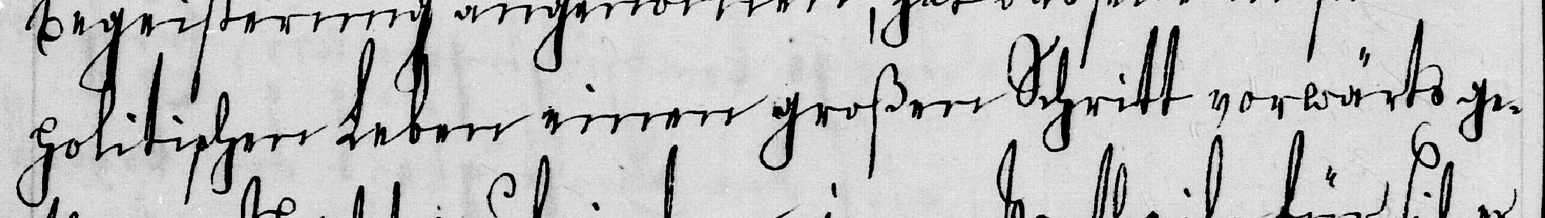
politischen Leben einen großen Schritt vorwärts ge¬
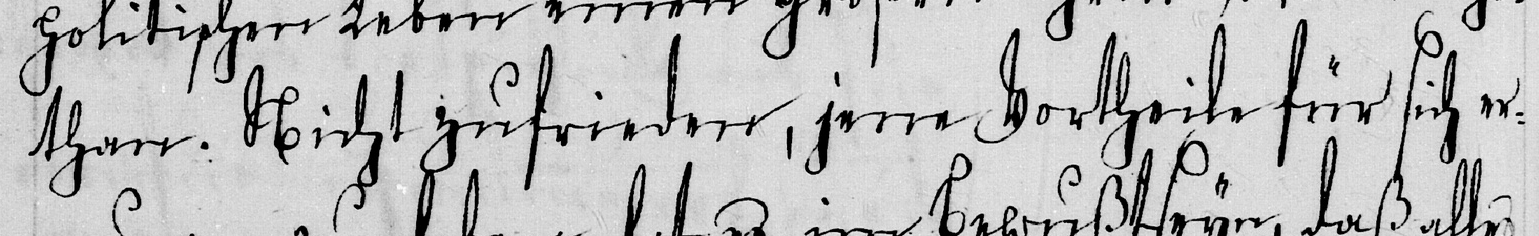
than. Nicht zufrieden, jene Vortheile für sich e¬
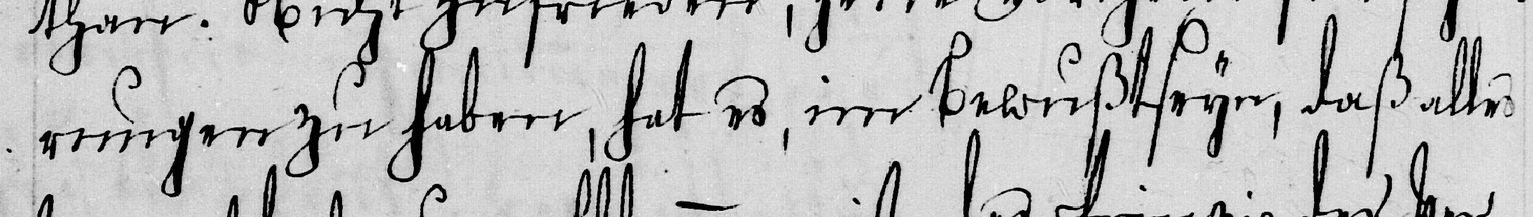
rrungen zu haben, hat es, im Bewußtseyn, daß alles
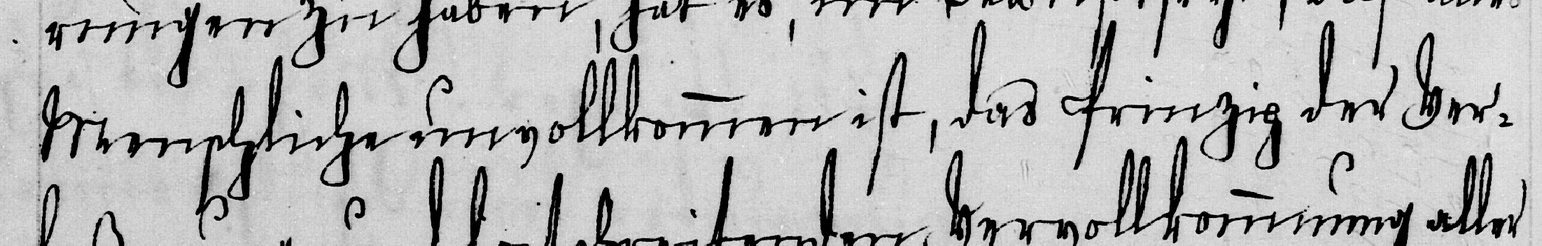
Menschliche unvollkommen ist, das Prinzip der Ver¬
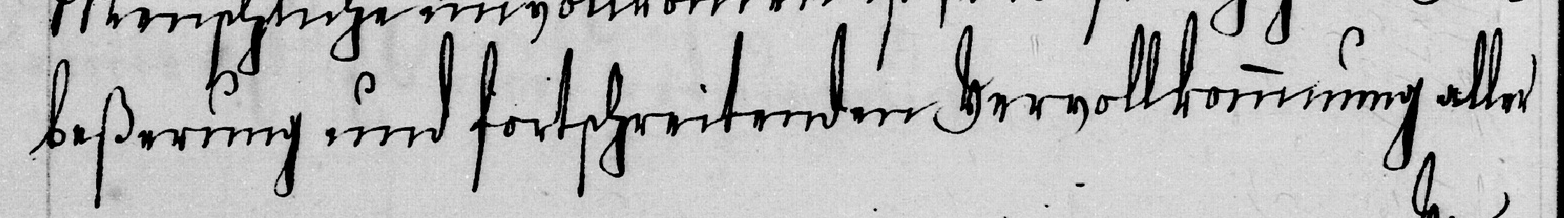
beßerung und fortschreitenden Vervollkommnung all¬
